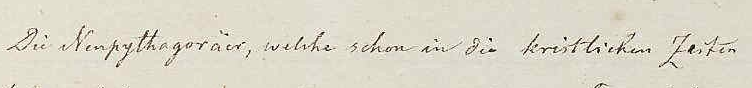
Die Neupythagoräer, welche schon in die kristlichen Zeiten
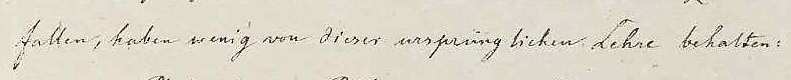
fallen, haben wenig von dieser ursprünglichen Lehre behalten:
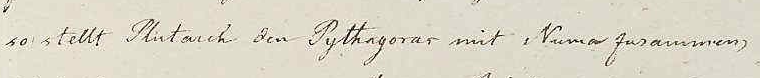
so stellt Plutarch den Pythagoras mit Numa zusammen,
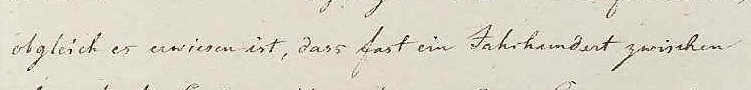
obgleich es erwiesen ist, dass fast ein Jahrhundert zwischen
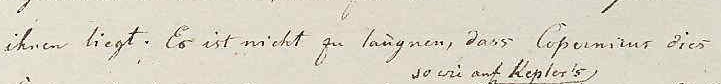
ihnen liegt. Es ist nicht zu läugnen, dass Copernicus dies
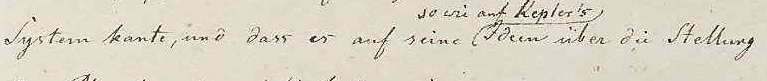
System kante, und dass es auf seine so wie auf Kepler's Ideen über die Stellung
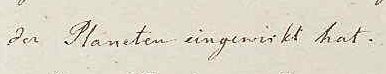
der Planeten eingewirkt hat.
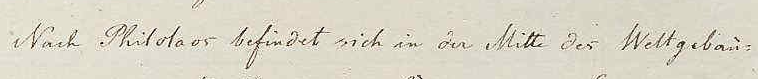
Nach Philolaos befindet sich in der Mitte des Weltgebäu-
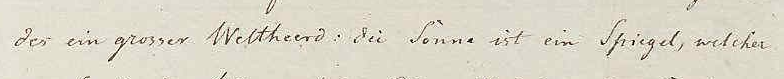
des ein grosser Weltheerd: die Sonne ist ein Spiegel, welcher
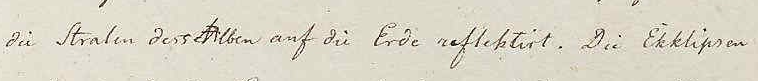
die Stralen dessMelben auf die Erde reflektirt. Die Ekklipsen
